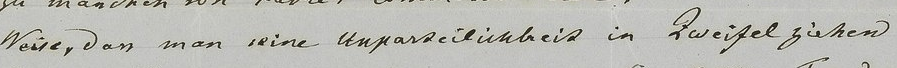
Weise, dass man seine Unparteilichkeit in Zweifel ziehen
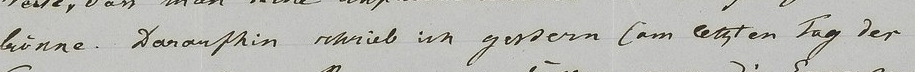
könne. Daraufhin schrieb ich gestern (am letzten Tag des
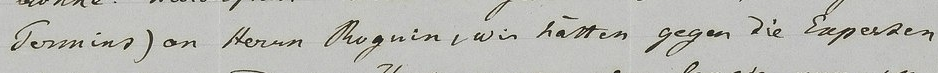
Termins) an Herrn Rognin, wir hätten gegen die Experten
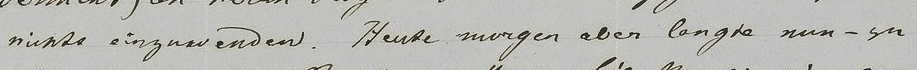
nichts einzuwenden. Heute morgen aber langte nun – zu
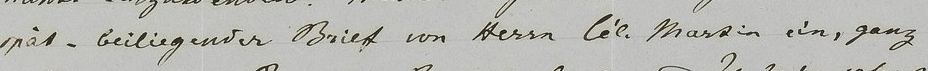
spät – beiliegender Brief von Herrn Cél. Martin ein, ganz
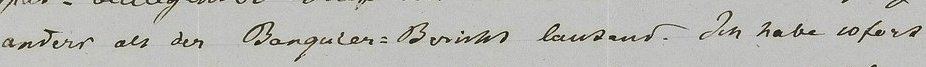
anders als der Banquier-Bericht lautend. Ich habe sofort
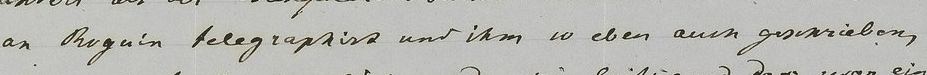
an Rognin telegraphirt und ihm so eben auch geschrieben,
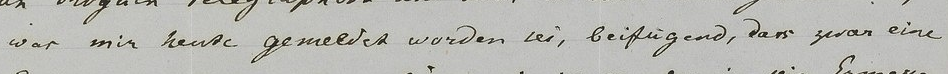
was mir heute gemeldet worden sei, beifügend, dass zwar eine
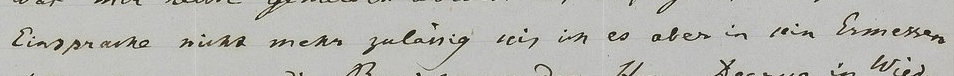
Einsprache nicht mehr zulässig sei, ich es aber in sein Ermessen
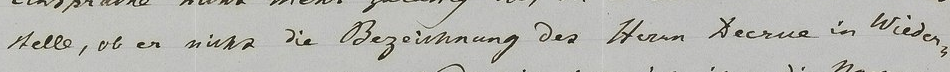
stelle, ob er nicht die Bezeichnung des Herrn Decrue in Wieder-
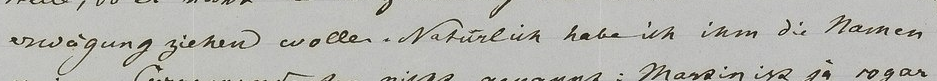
erwägung ziehen wolle. Natürlich habe ich ihm die Namen
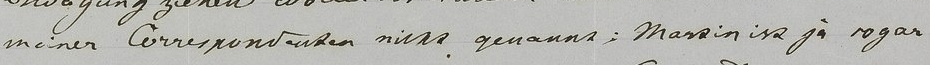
meiner Correspondenten nicht genannt: Martin ist ja sogar
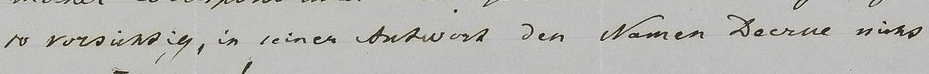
so vorsichtig, in seiner Antwort den Namen Decrue nicht
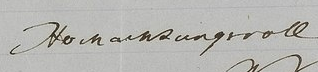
Hochachtungsvoll
